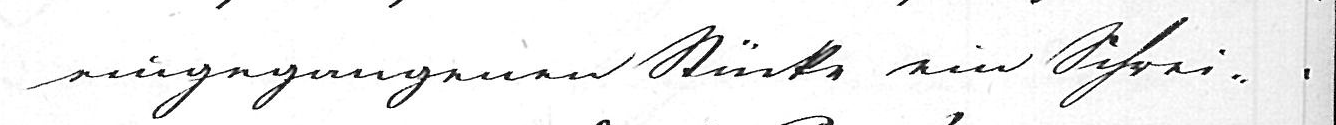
eingegangenen Stücke ein Schrei-
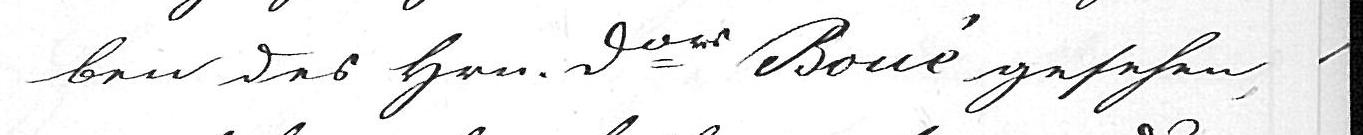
ben des Hrn. Dor Boué gesehen
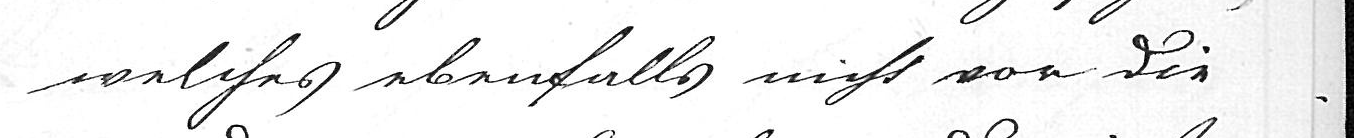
welches ebenfalls nicht vor die
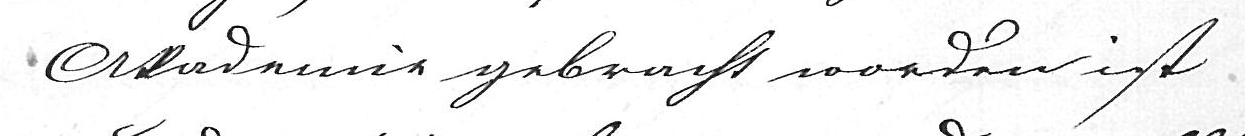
Akademie gebracht worden ist
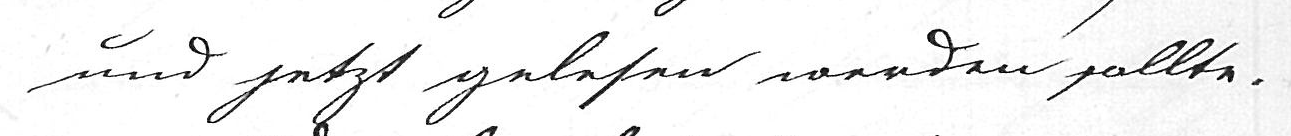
und jetzt gelesen werden sollte.
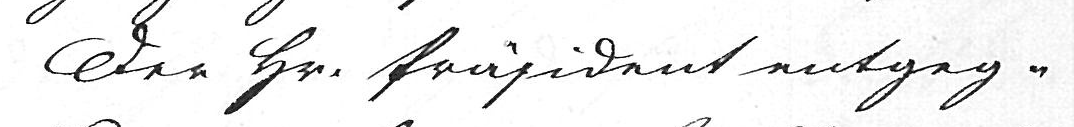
Der Hr. Präsident entgeg-
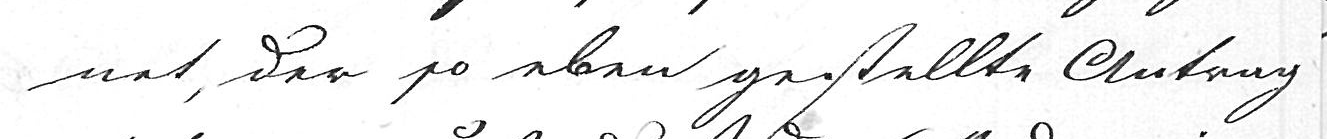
net, der so eben gestellte Antrag
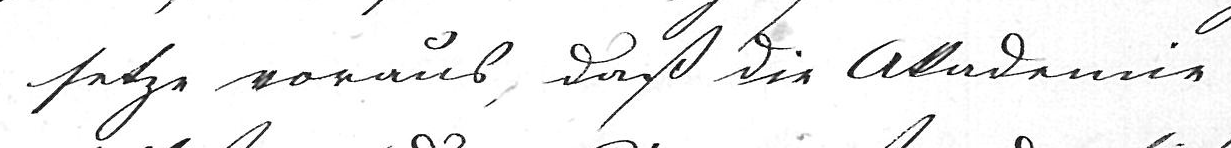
setze voraus, daß die Akademie
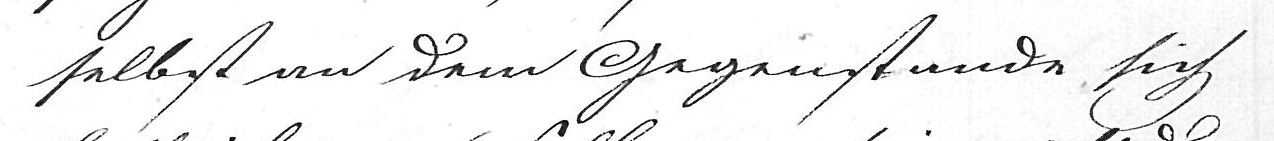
selbst an dem Gegenstande sich
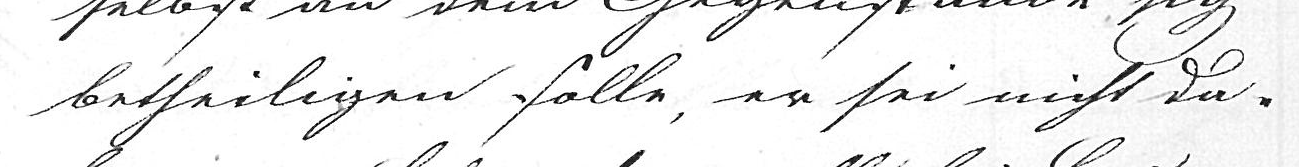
betheiligen solle, er sei nicht da-
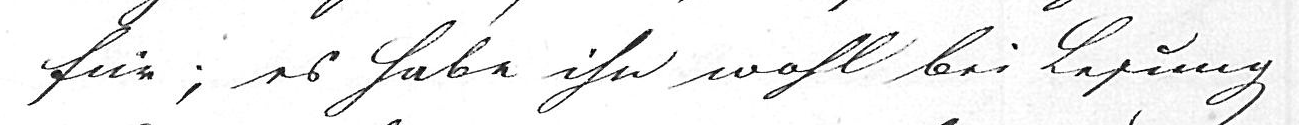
für; es habe ihn wohl bei Lesung
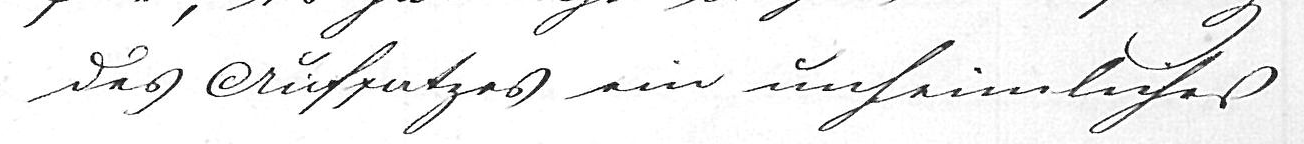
des Aufsatzes ein unheimliches
